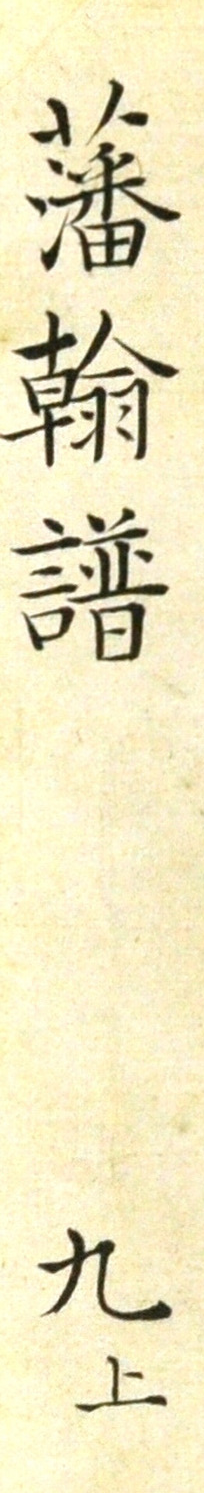藩翰譜九上

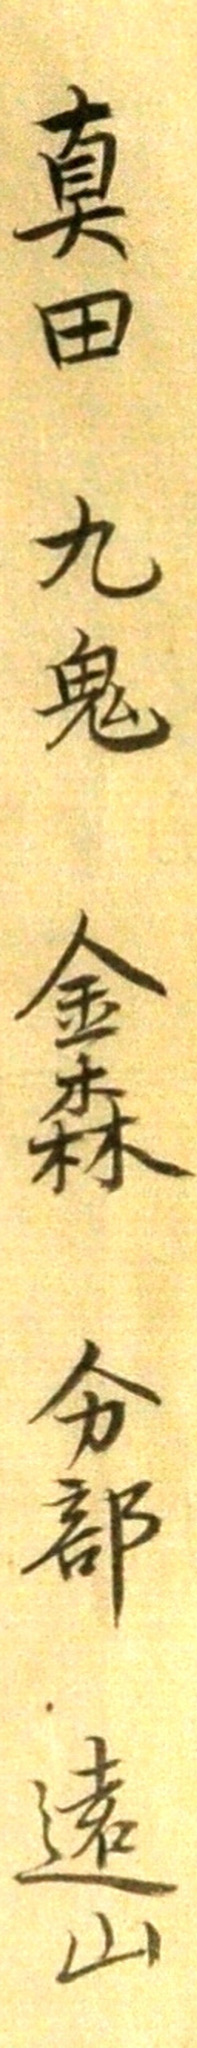真田九鬼金森分部遠山
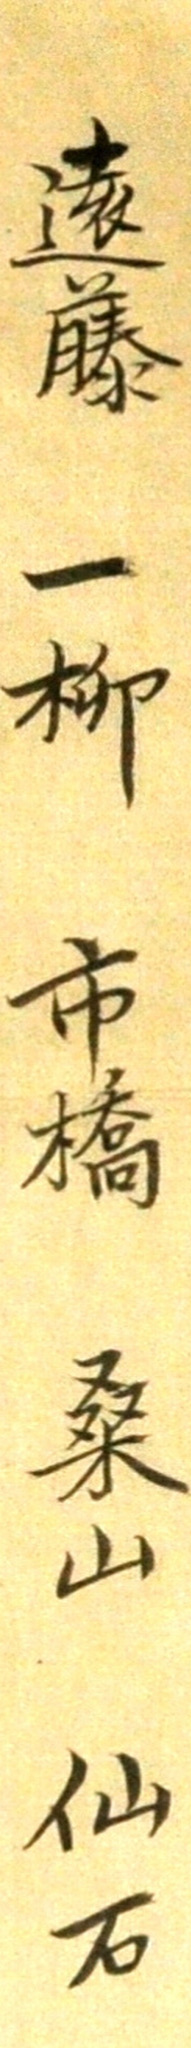遠藤一柳市橋桑山仙石
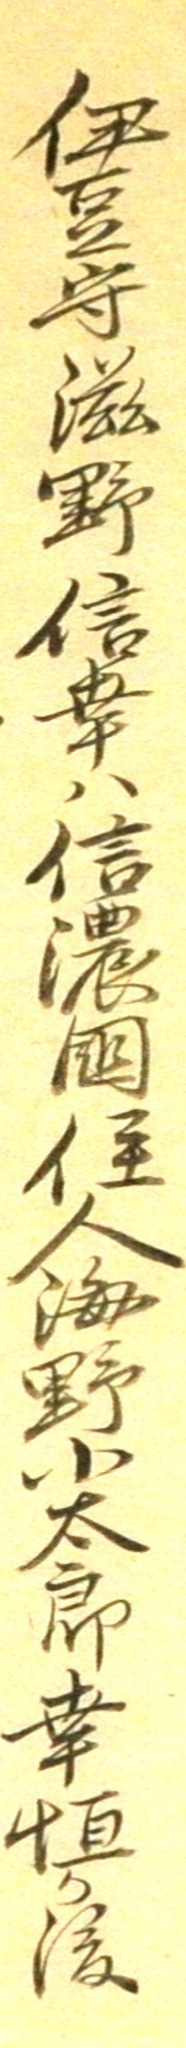伊豆守滋野信幸は信濃国住人海野小太郎幸恒か後

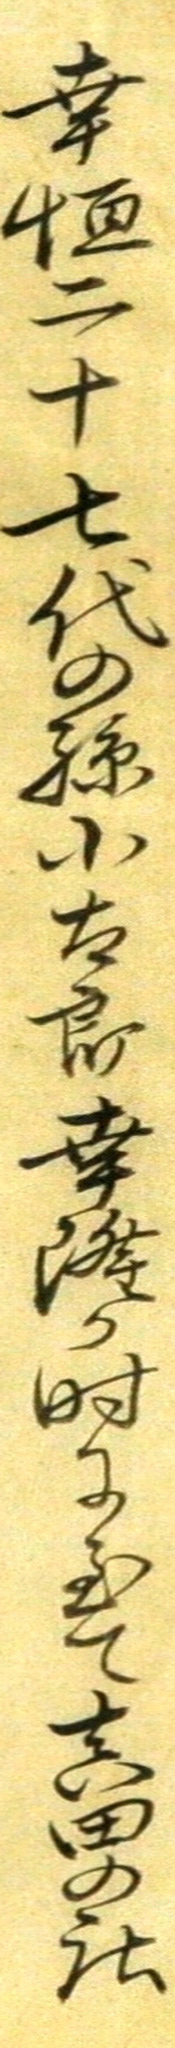幸恒二十七代の孫小太郎幸隆か時に至て真田の庄
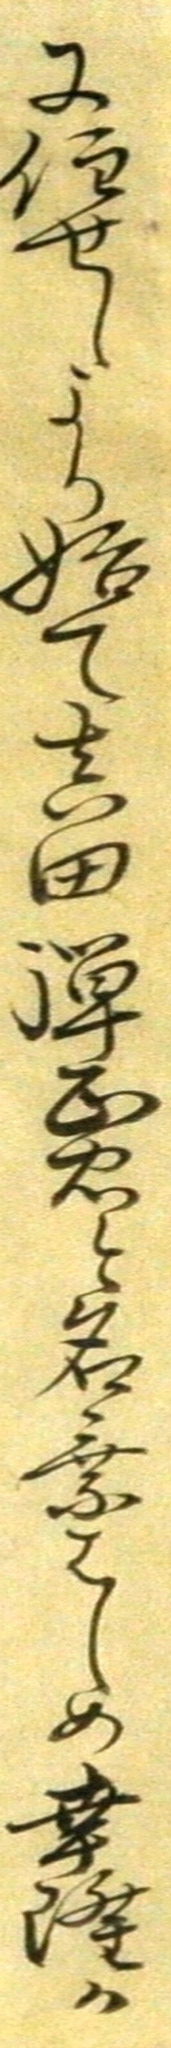に住せしより始て真田弾正忠と名乗はしめ幸隆か
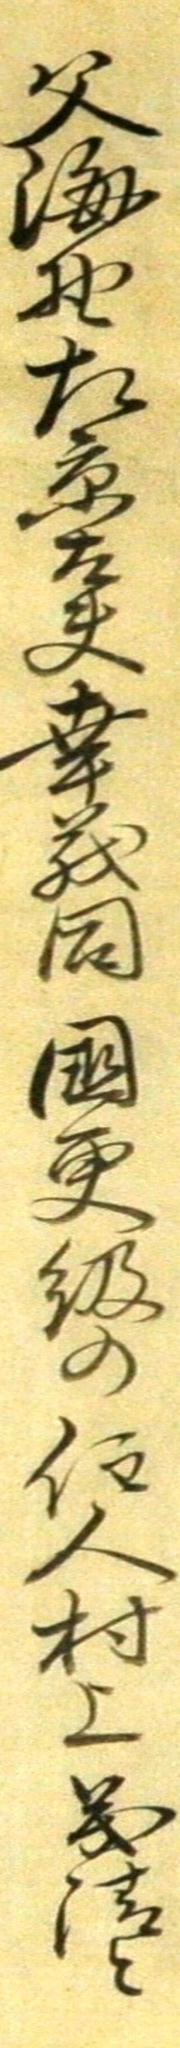父海野左京大夫幸義同国更級の住人村上義清と
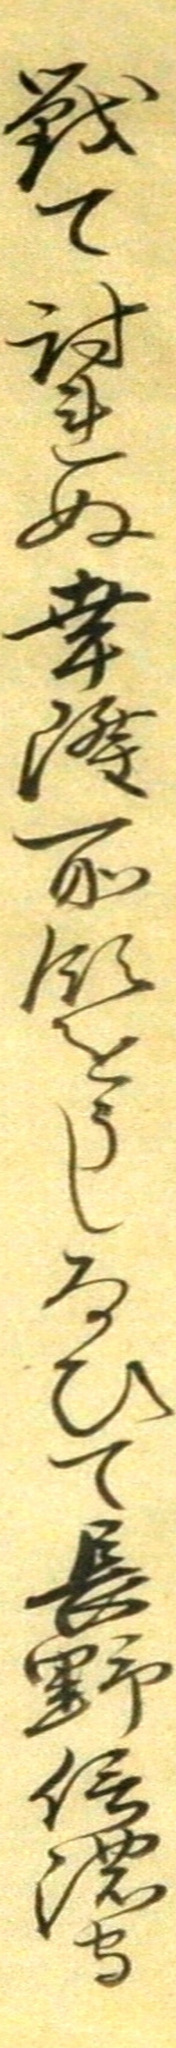戦て討れぬ幸隆所領をうしなひて長野信濃守
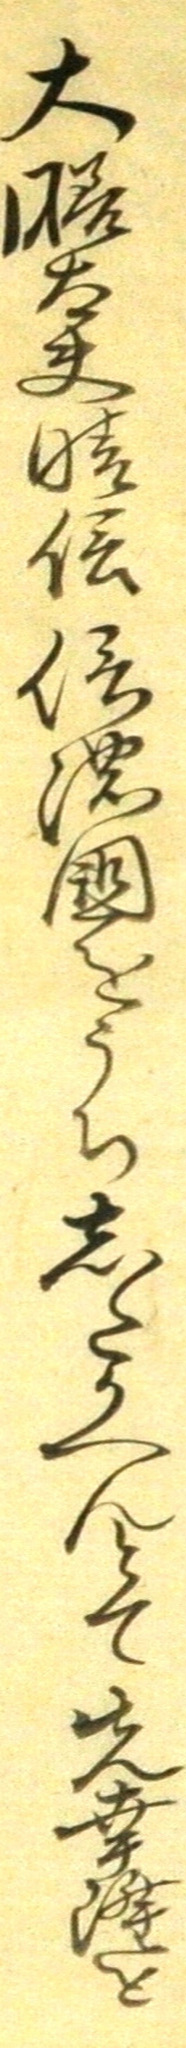大膳大夫晴信信濃国をうちしたかへんとて先幸隆を
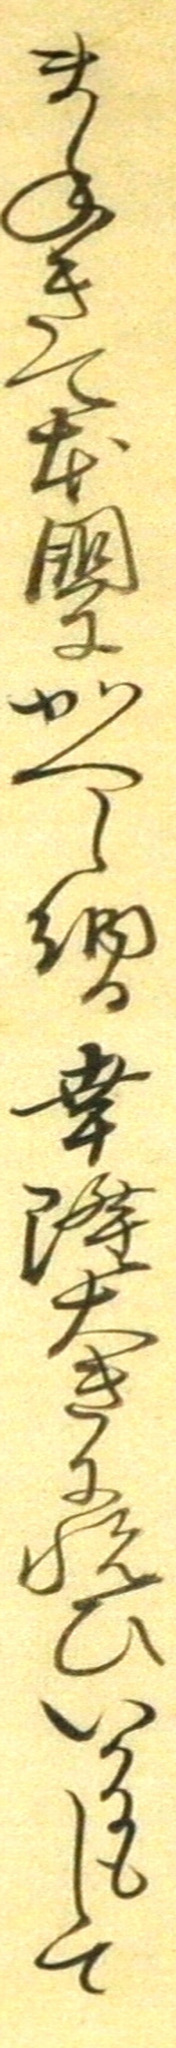まねきて本国にかへし納る幸隆大きに悦ひいかにもして
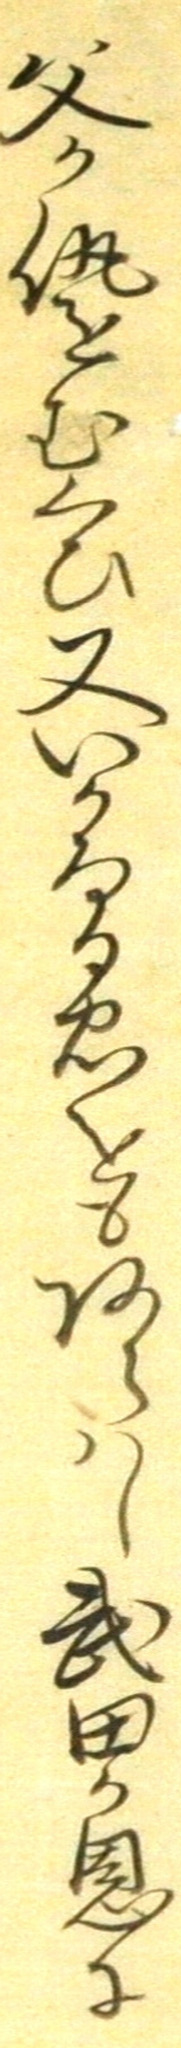父か仇をむくひ又いかなる忠をもあらはし武田か恩に
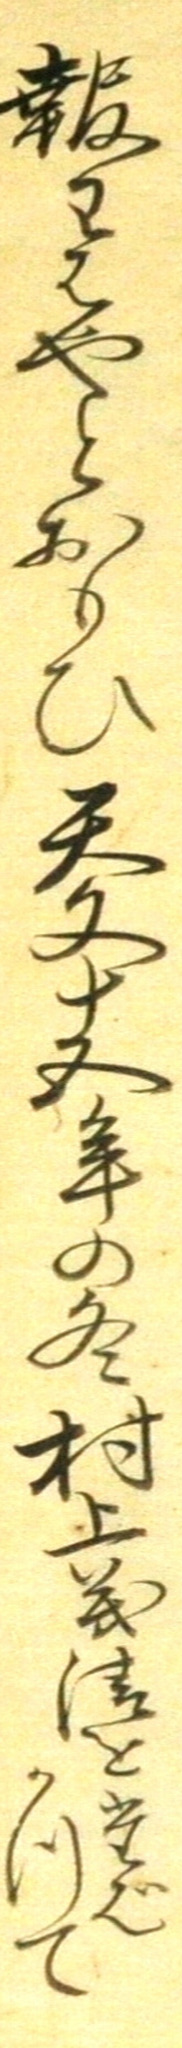報わはやとおもひ天文十五年の冬村上義清をたばかつて
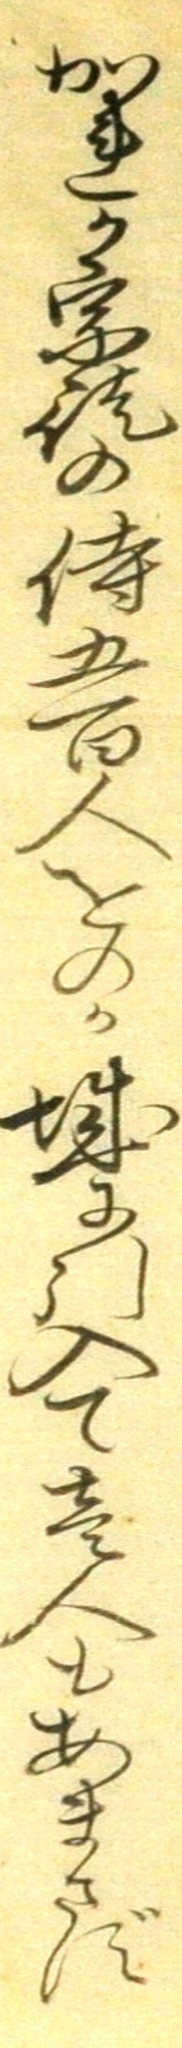かれか宗徒の侍五百人をのか城に引入て壱人もあまさず
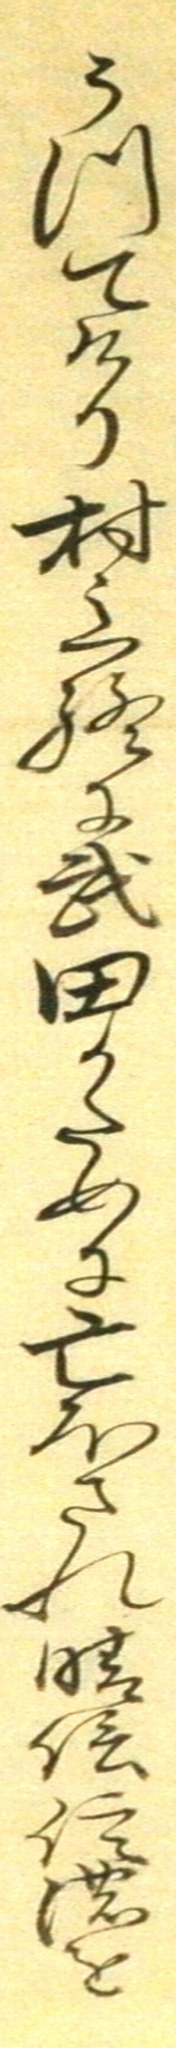うつてけり村上終に武田かために亡ほされ晴信信濃を
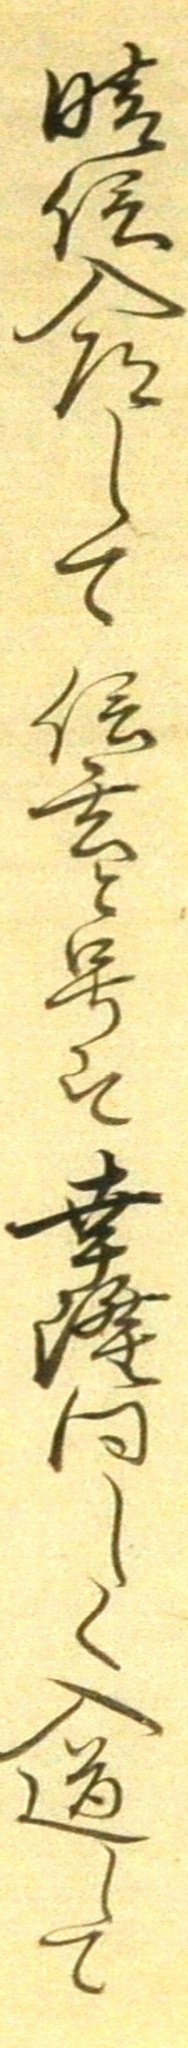晴信入道して信玄と号す幸隆同しく入道して
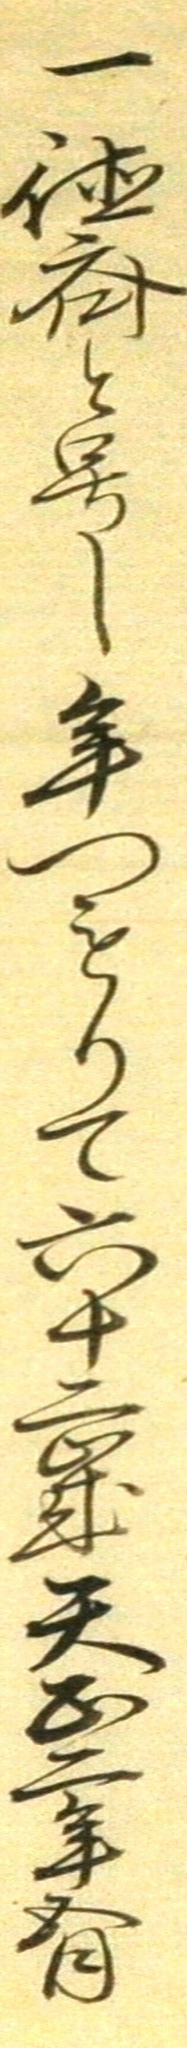一徳斉と号し年つもりて六十二歳天正二年五月
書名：藩翰譜（九・上）
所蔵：伊那市立高遠町図書館・合同会社AMANE
